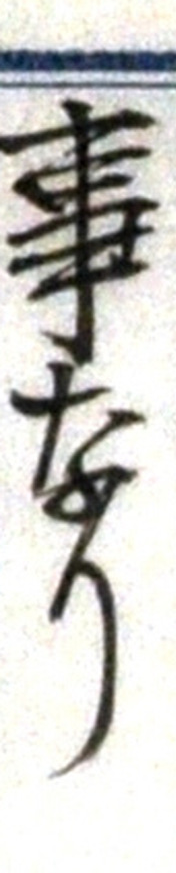事なり
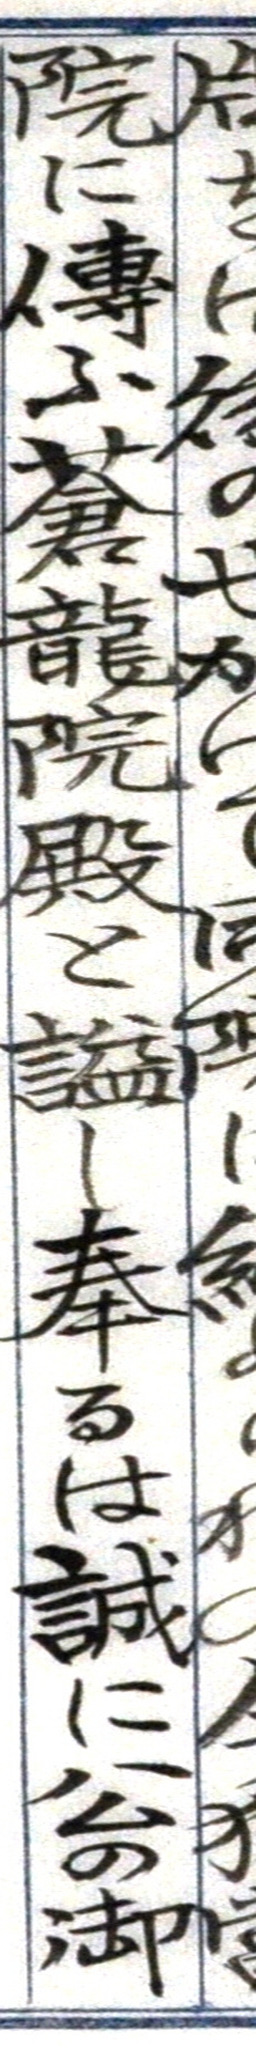院に伝ふ蒼龍院殿と謚し奉るは誠に公の御
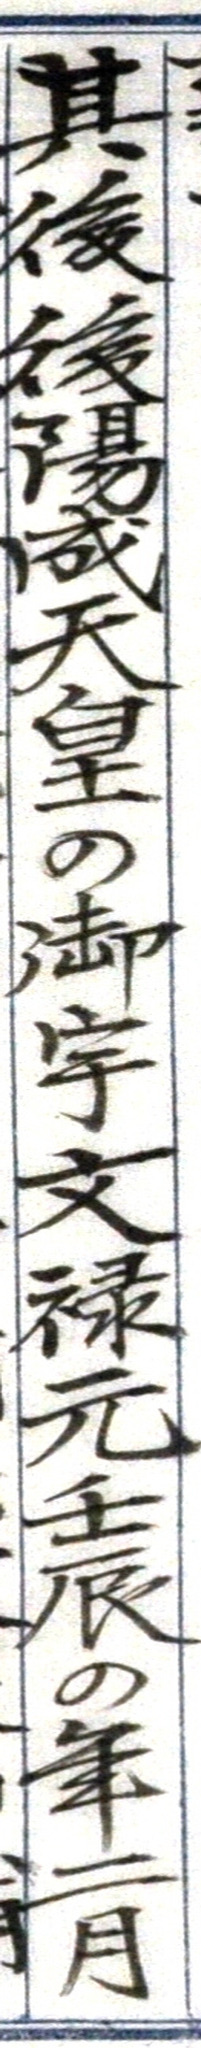其後後陽成天皇の御宇文禄元壬辰の年二月
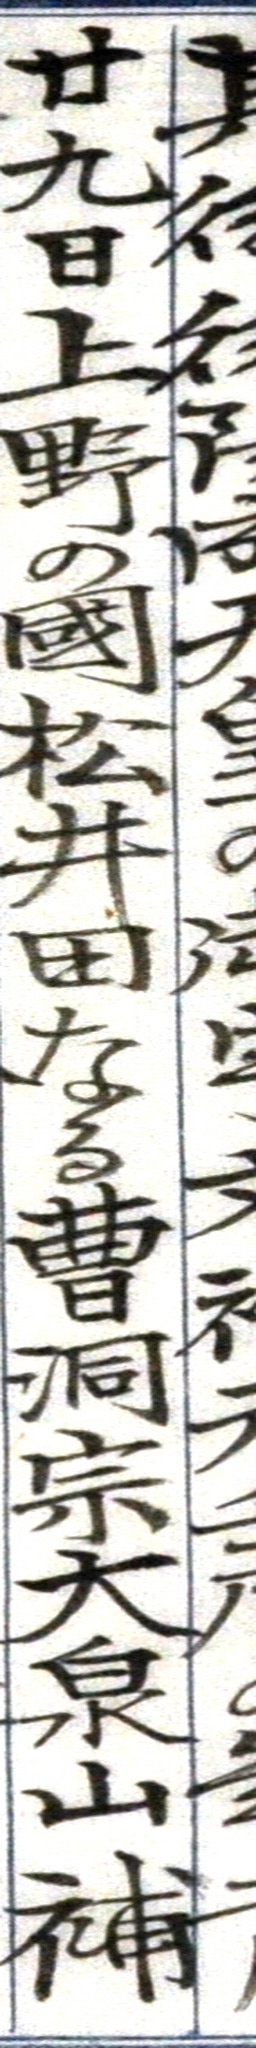廿九日上野の国松井田なる曹洞宗大泉山補
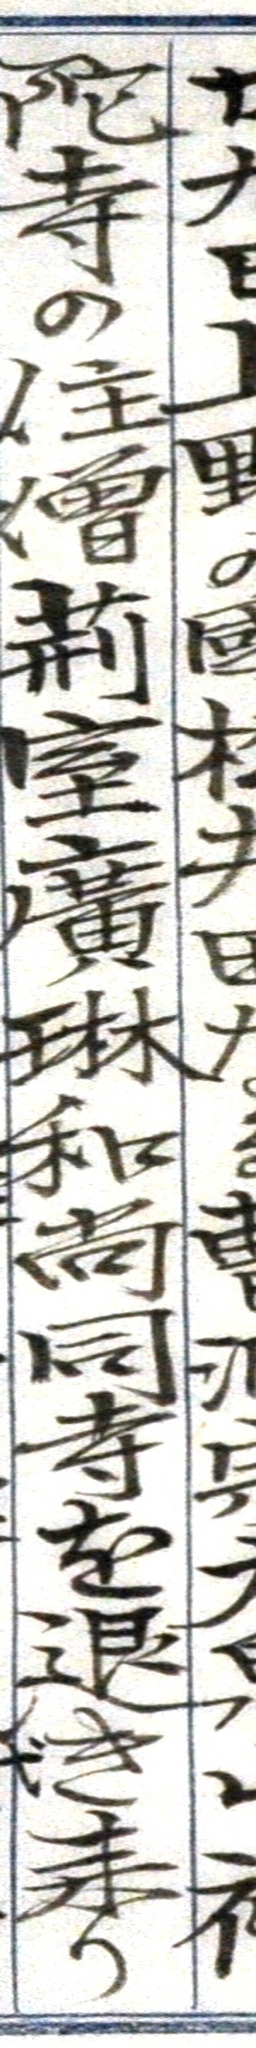陀寺の住僧荊室広琳和尚同寺を退き来り
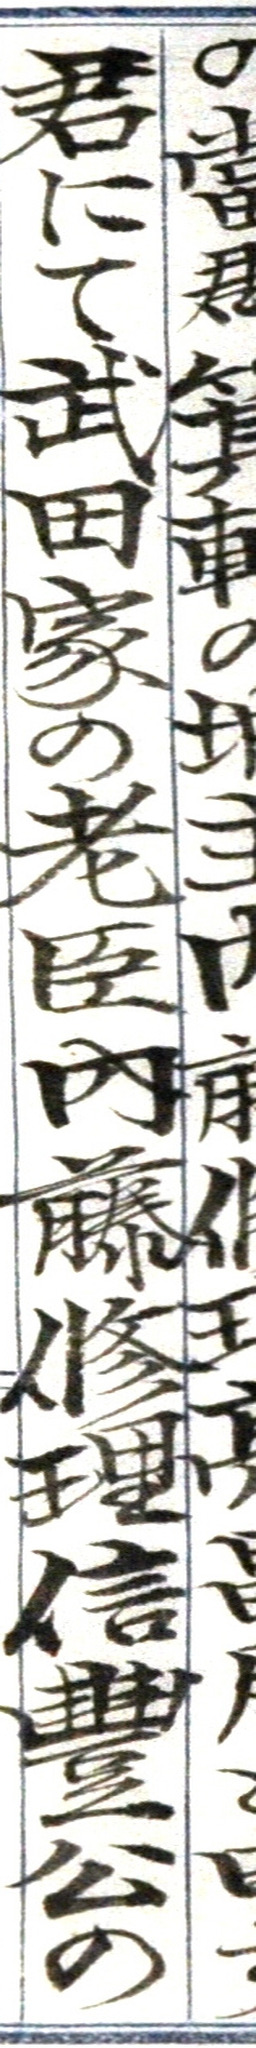君にて武田家の老臣内藤修理信豊公の
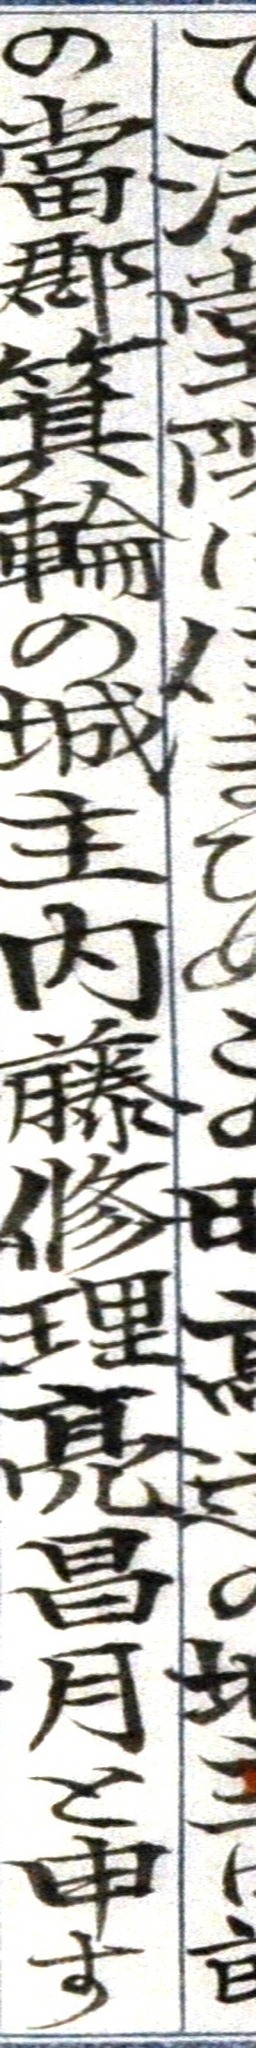の当郡箕輪の城主内藤修理亮昌月と申す

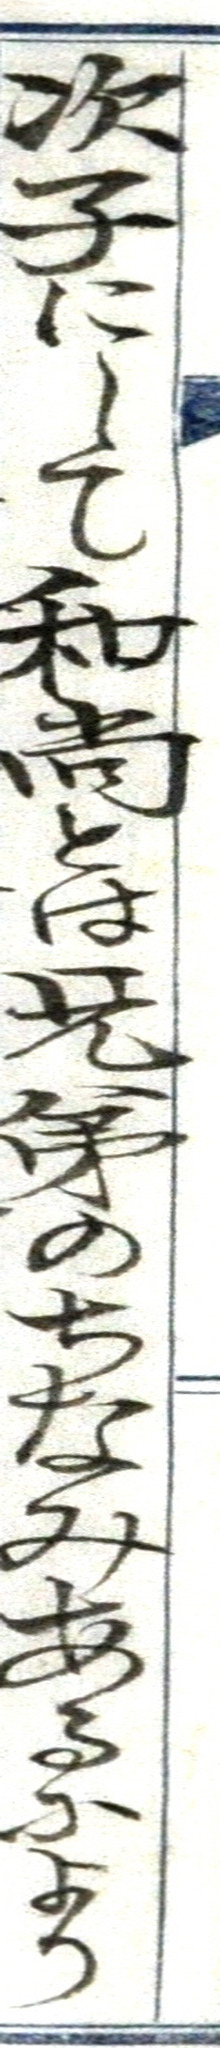次子にして和尚とは兄弟のちなみあるにより
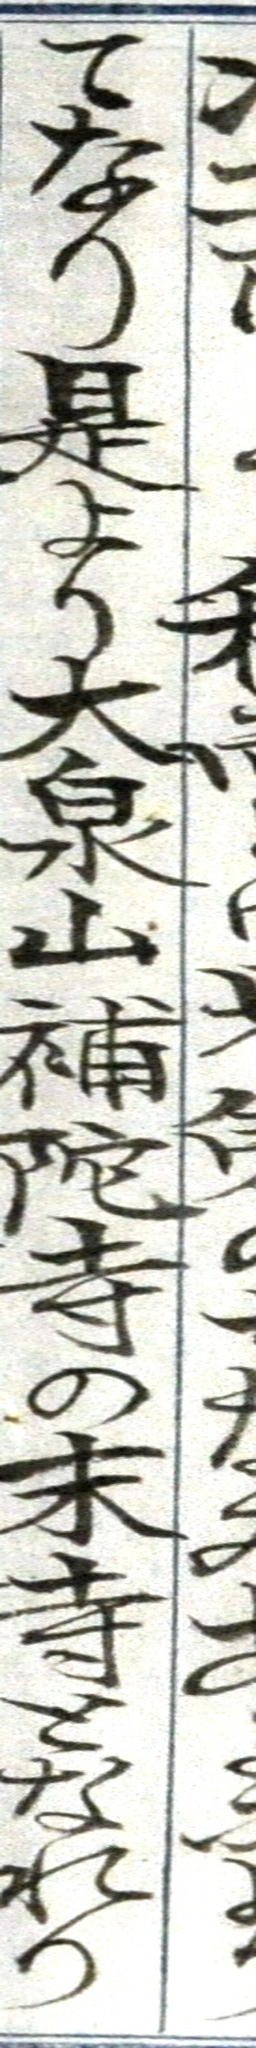てなり是より大泉山補陀寺の末寺となれり
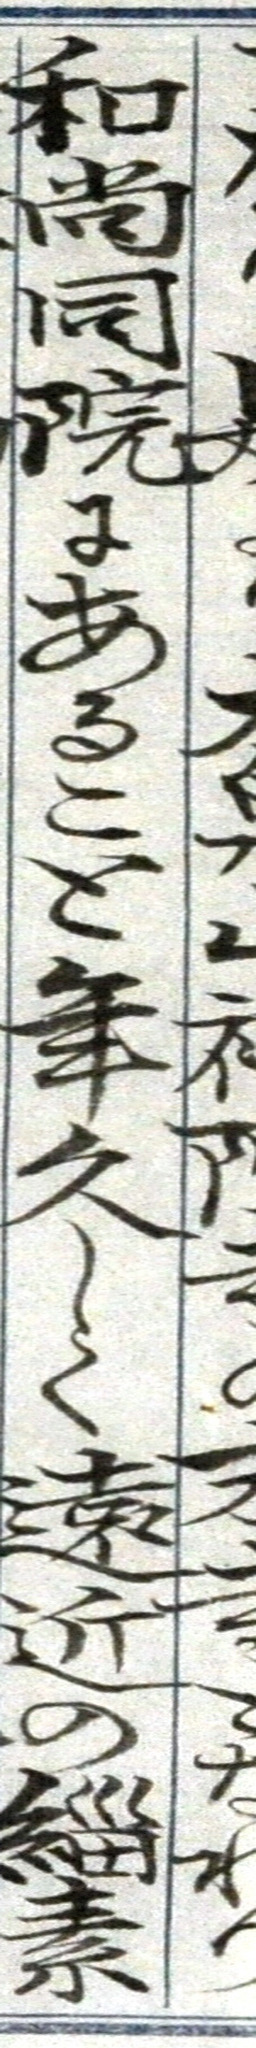和尚同院にあること年久しく遠近の緇素
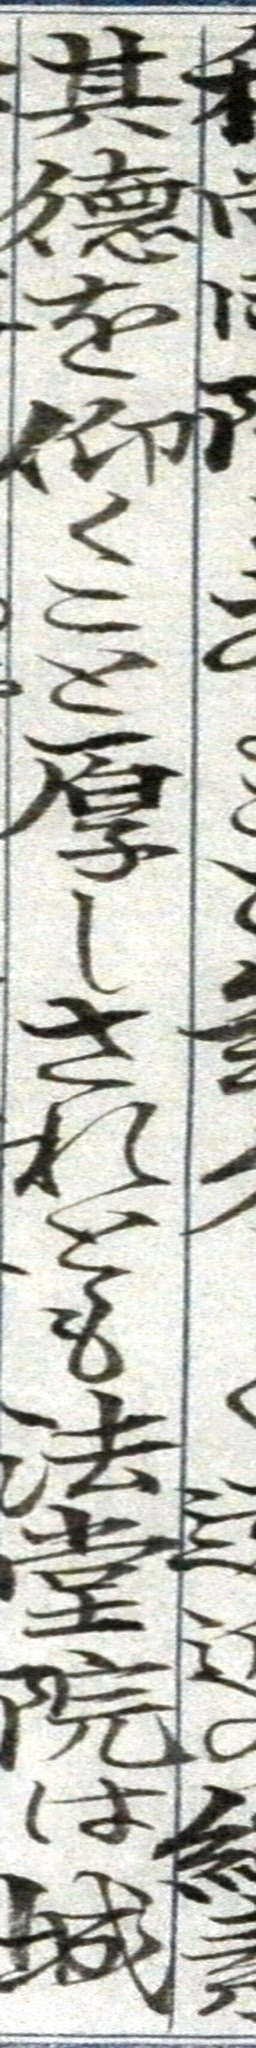其徳を仰くこと厚しされとも法堂院は城
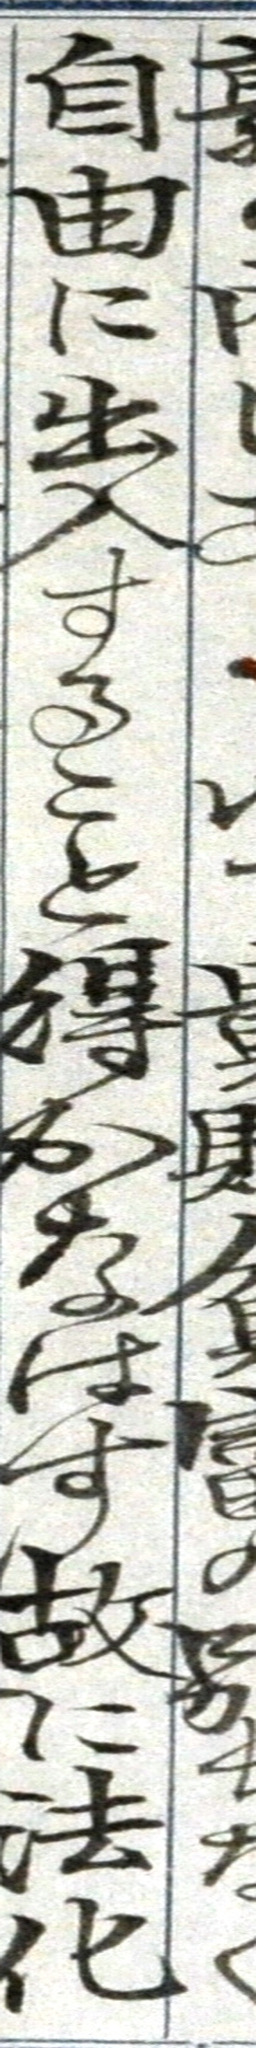自由に出入すること得かなはす故に法化
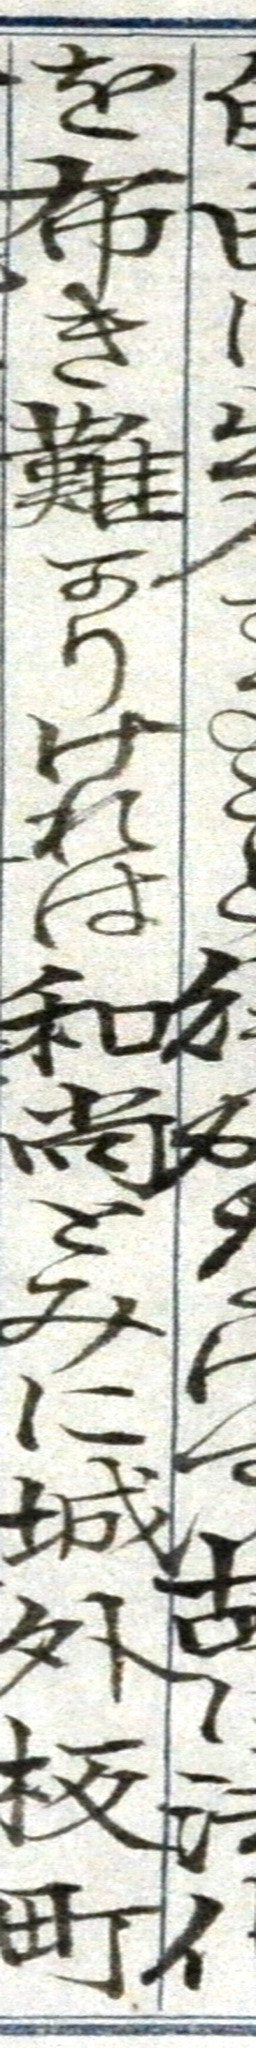を布き難かりけれは和尚とみに城外板町
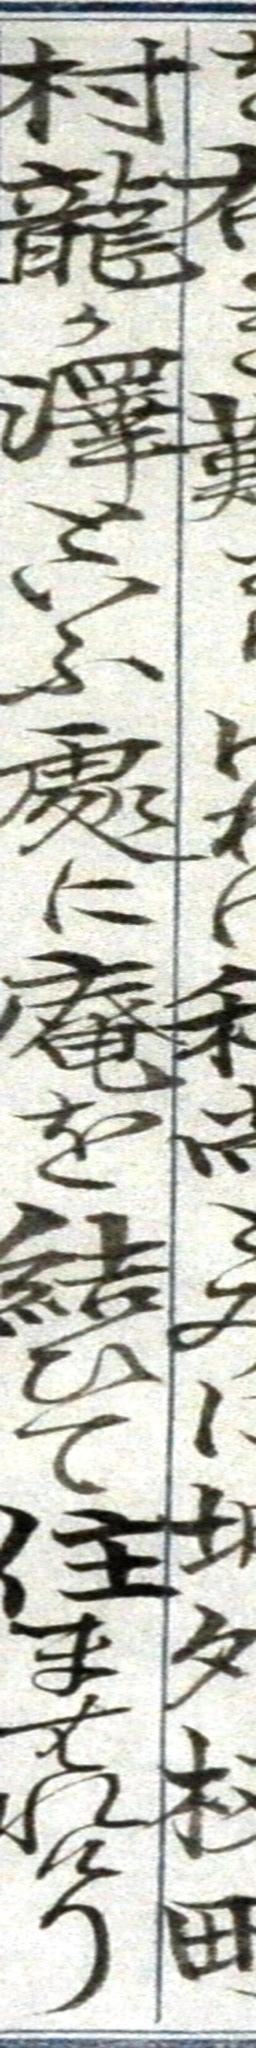村龍か澤といふ処に庵を結ひて住まはれけり
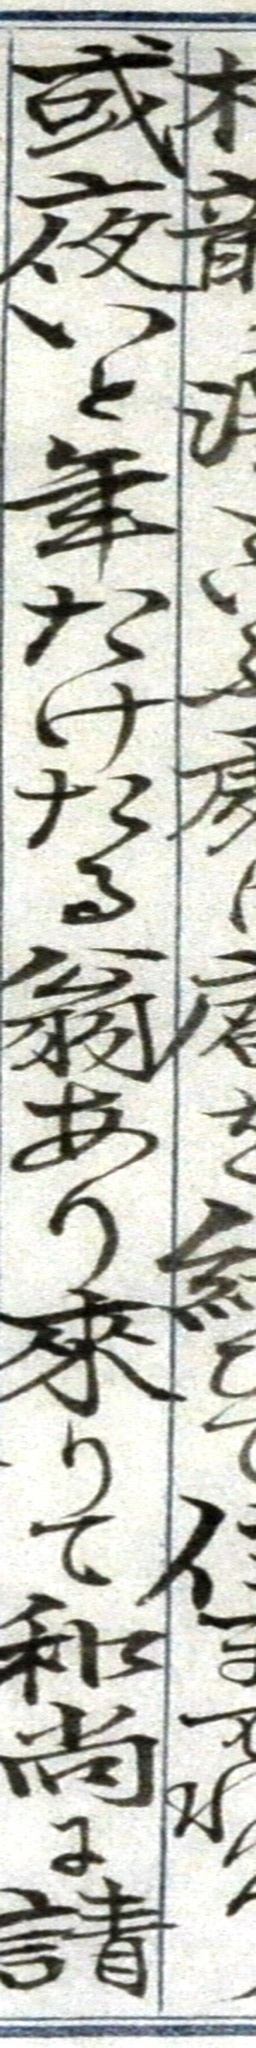或夜いと年たけたる翁あり来りて和尚に請
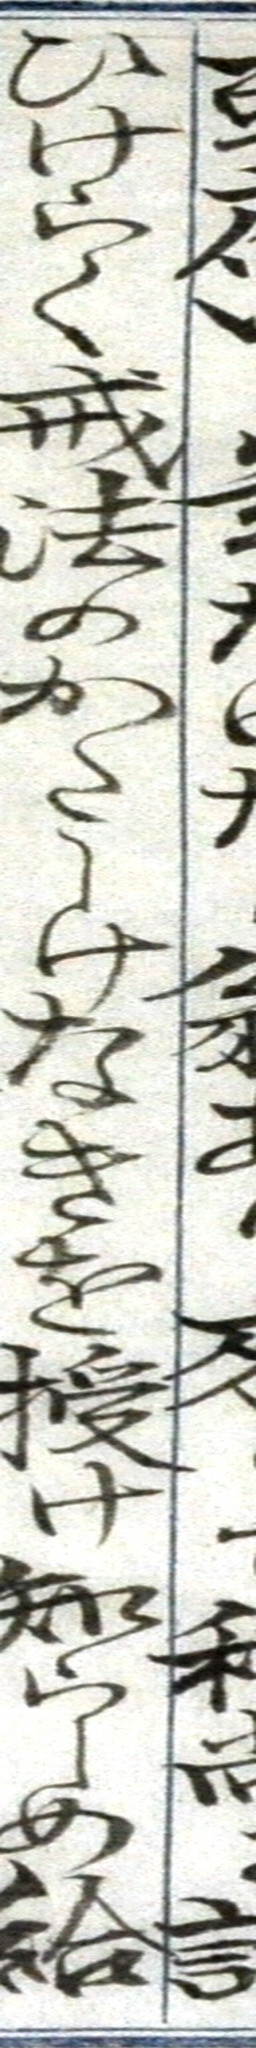ひけらく戒法のかたしけなきを授け知らしめ給
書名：桂泉院・樹林寺・東光寺縁起書、蓮華寺由来書、付夕顔観音記
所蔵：伊那市立高遠町図書館・合同会社AMANE
